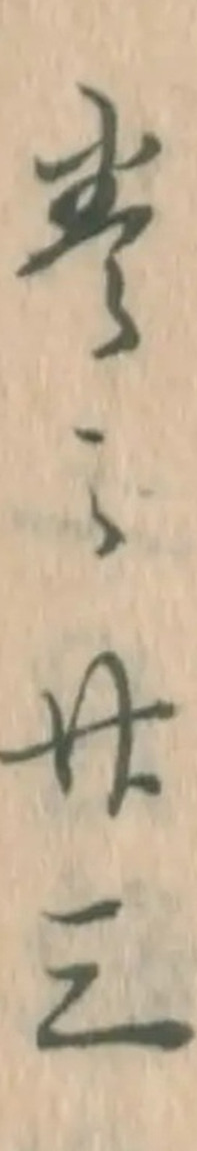巻之廿三
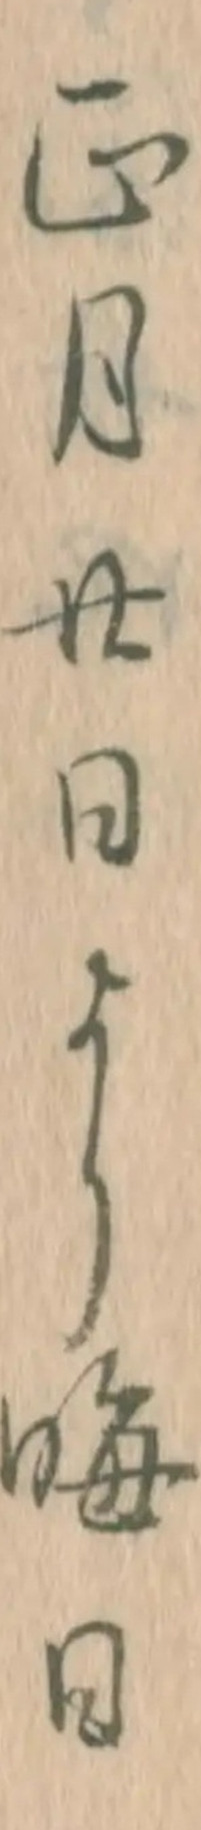正月廿日より晦日

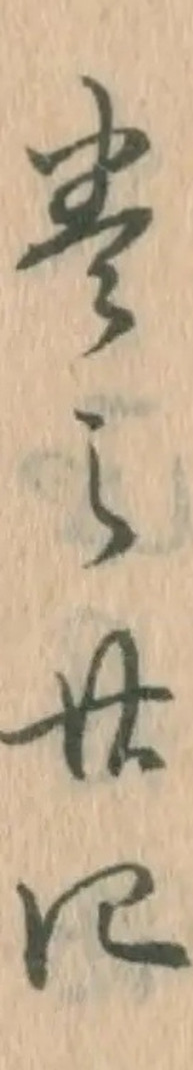巻之廿四
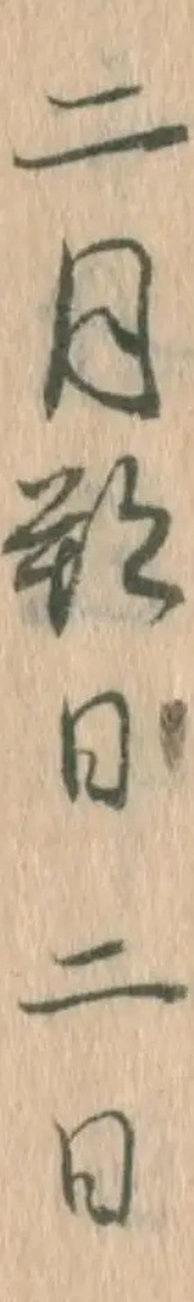二月朔日二日
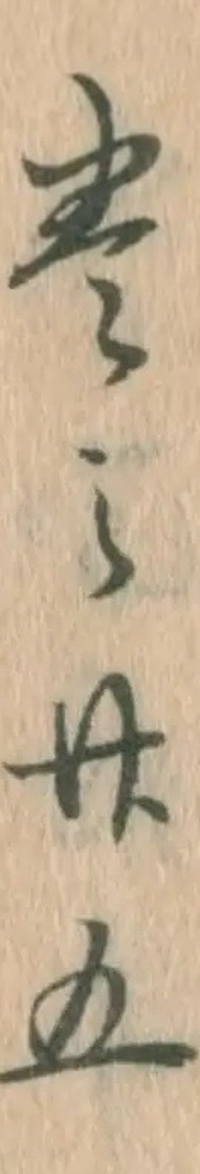巻之廿五
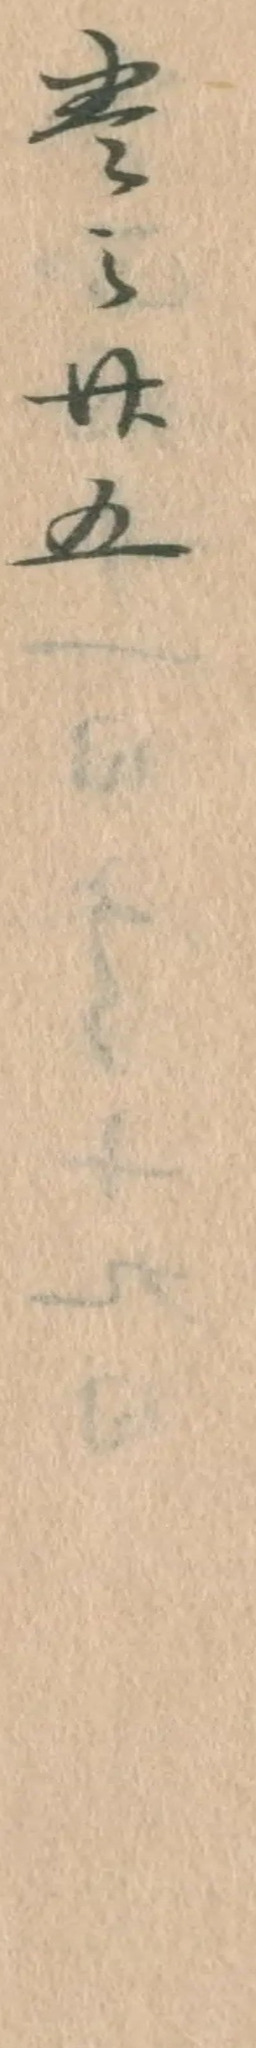巻之廿五
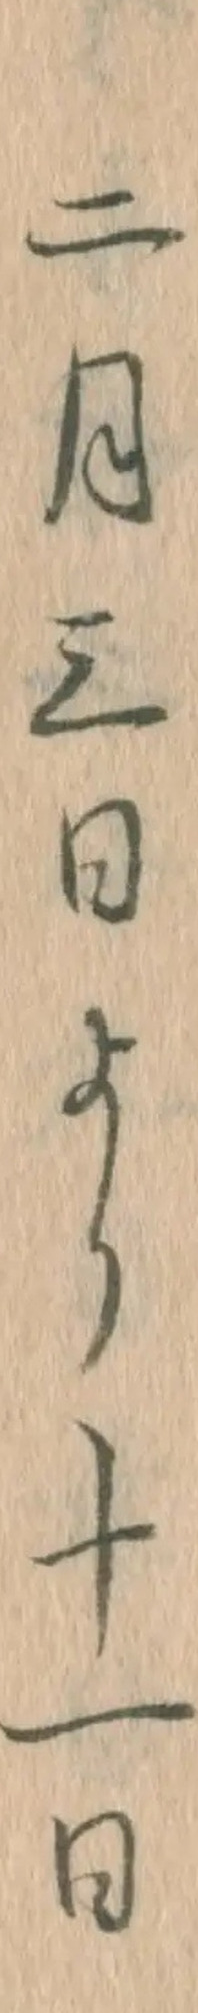二月三日より十一日
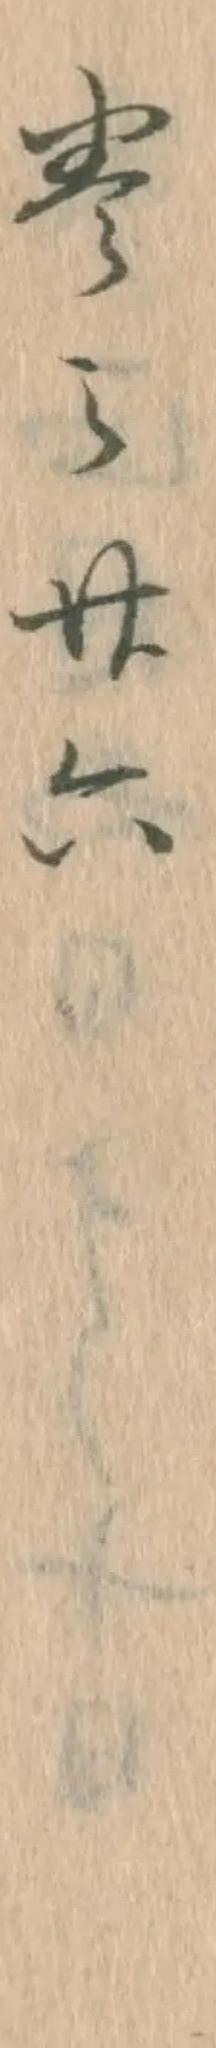巻之廿六
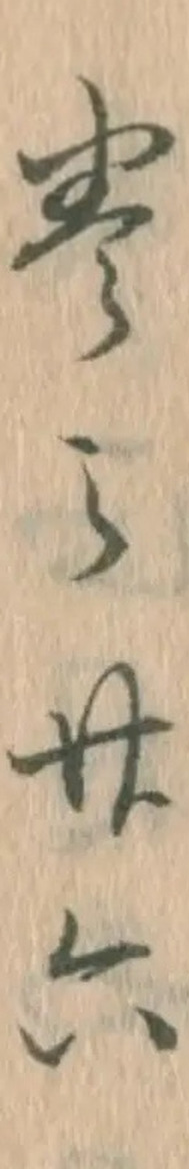巻之廿六
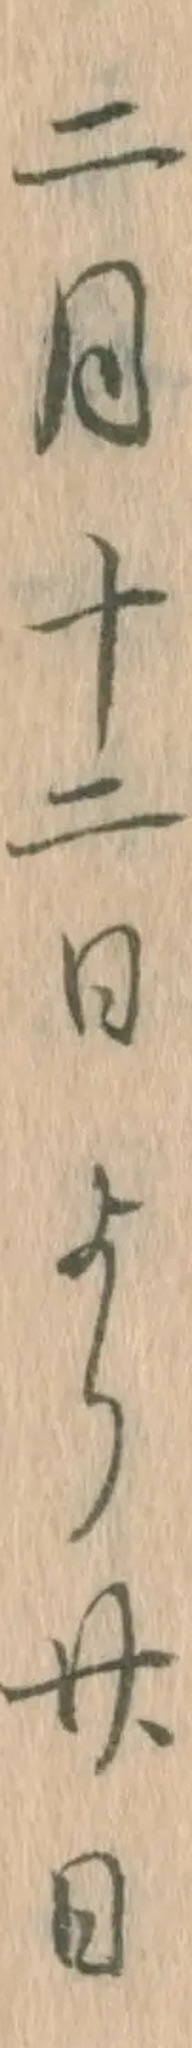二月十二日より廿日
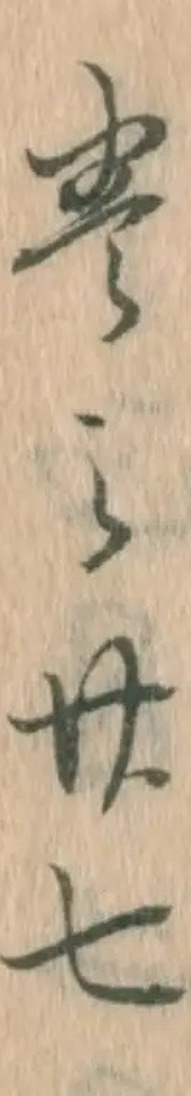巻之廿七
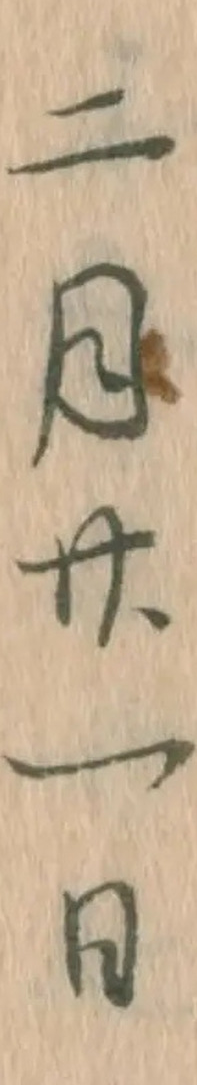二月廿一日
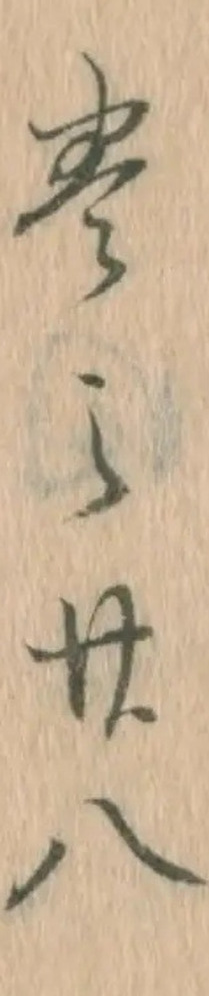巻之廿八
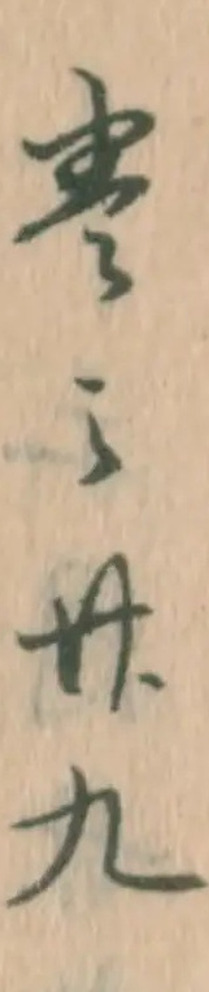巻之廿九
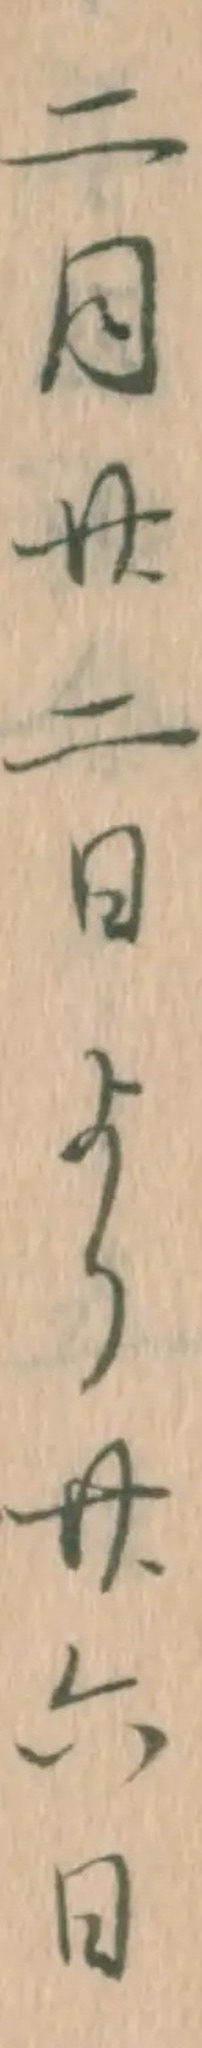二月廿二日より廿六日
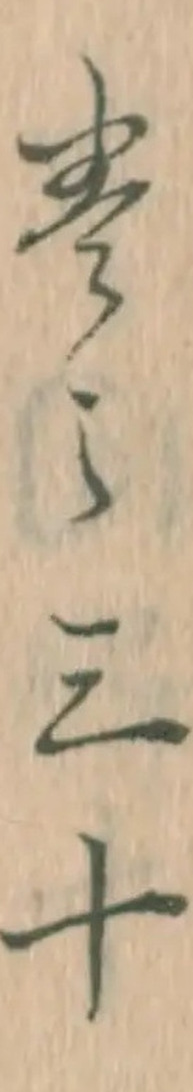巻之三十
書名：切支丹御退治記 49巻. [1]
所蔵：国立国会図書館 National Diet Library, JAPAN
